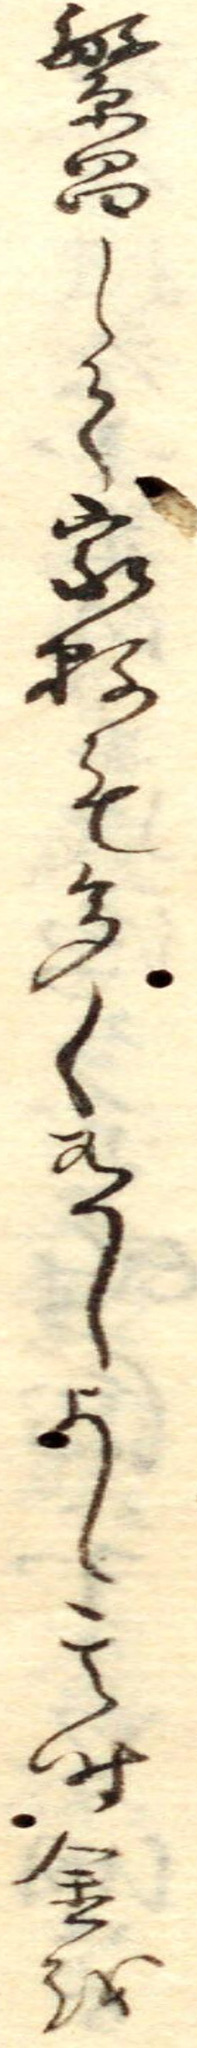繁昌して家数も多く有しよし其時金を
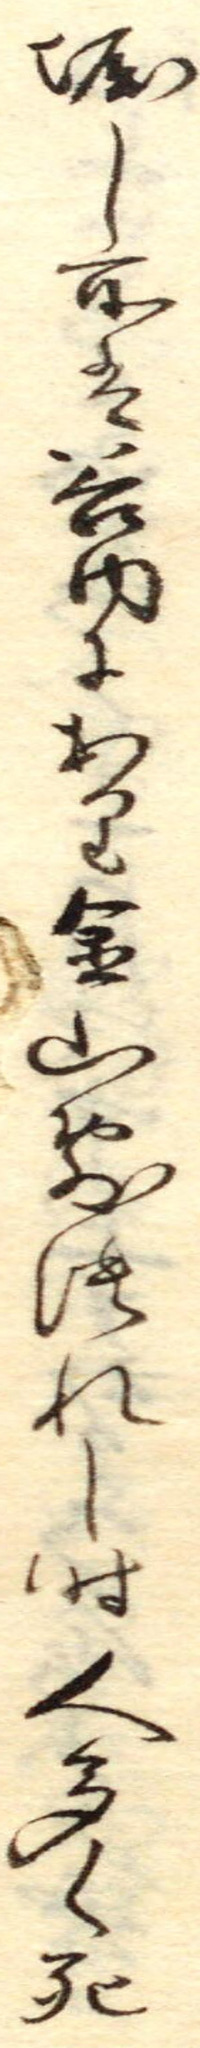掘し所は谷内にあり金山敷潰れし時人多く死
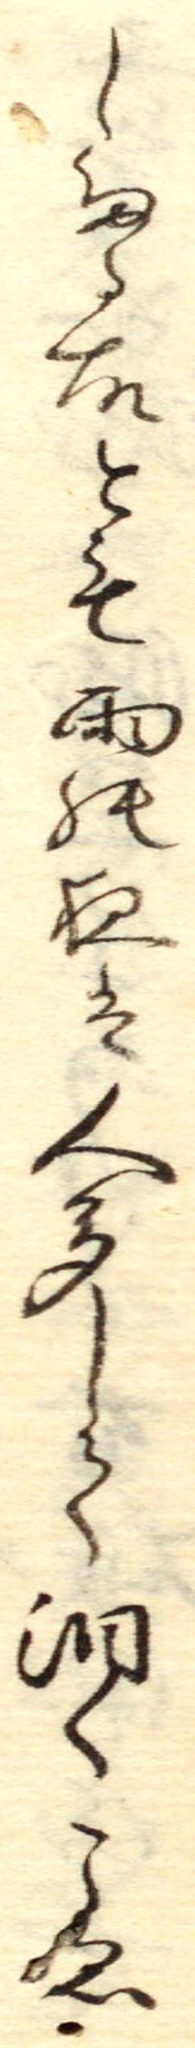したる故とも雨の夜は人多して泪くこゑ
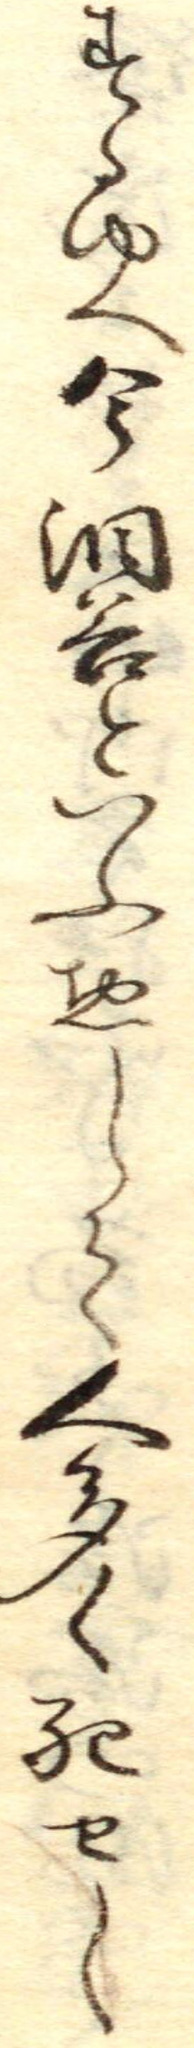するゆへ今泪谷といふ惣して人多く死せし
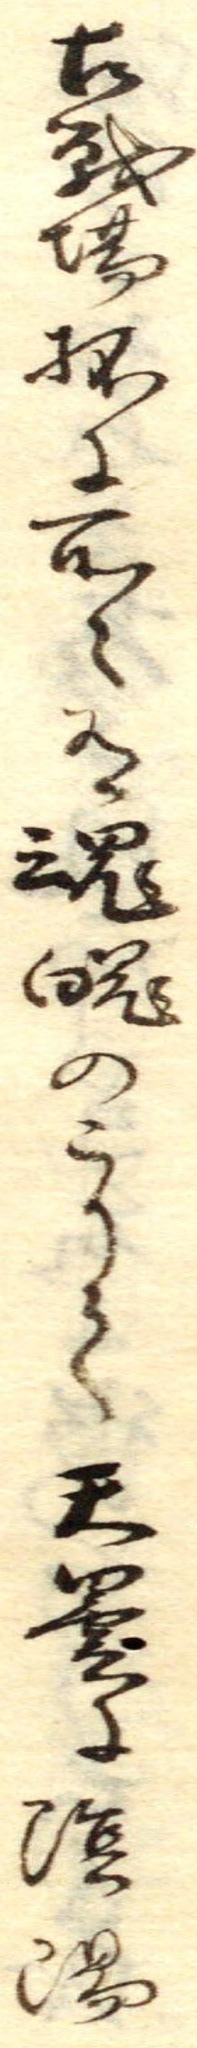古戦場抔に所々有魂魄のこりて天曇に陰陽
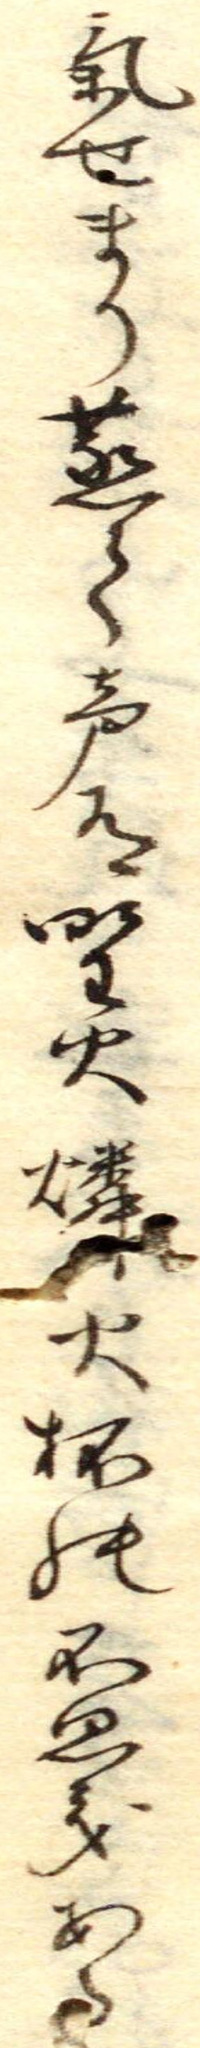気せまり蒸て声有野火燐火抔の不思義ある
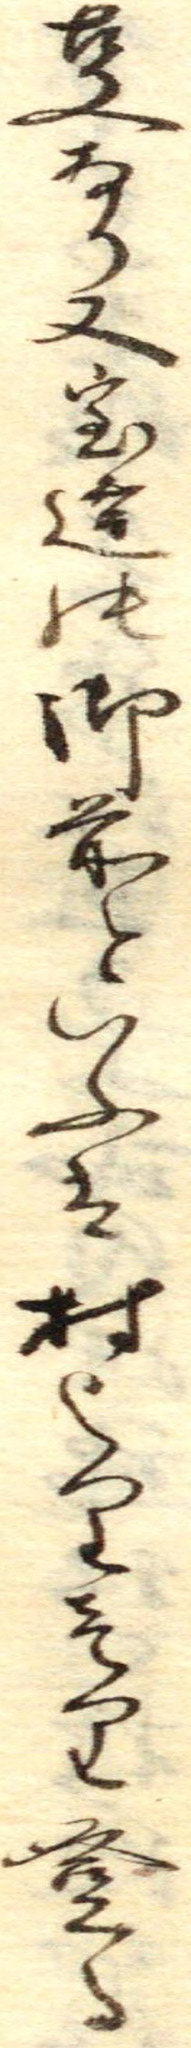事なり又方宝達の御前といふは村より壱里登る

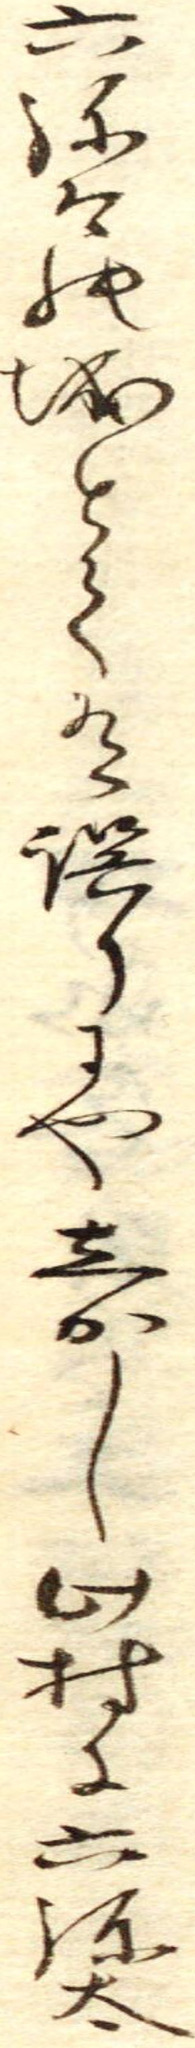六弥太の白城とて有誤りにやしかし此村に六弥太
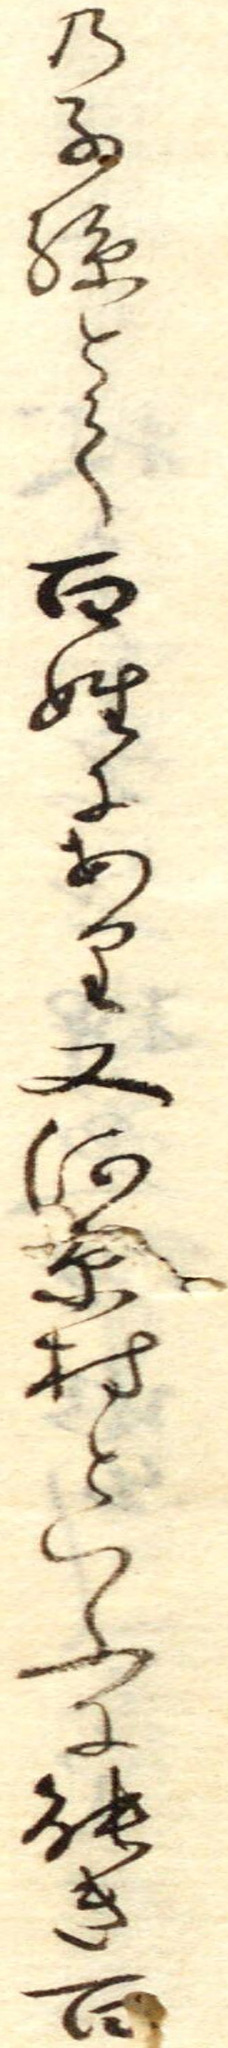の子孫とて百姓にあり又河原村といふに能き百
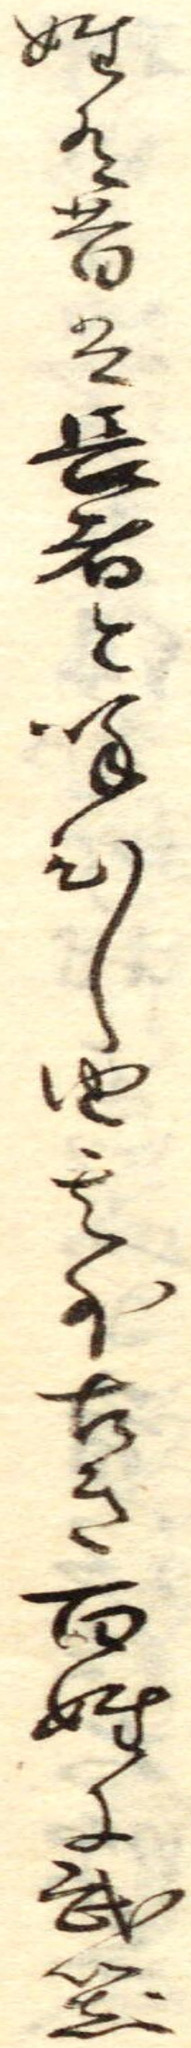姓有昔は長者と呼ひし由其外古き百姓に武器
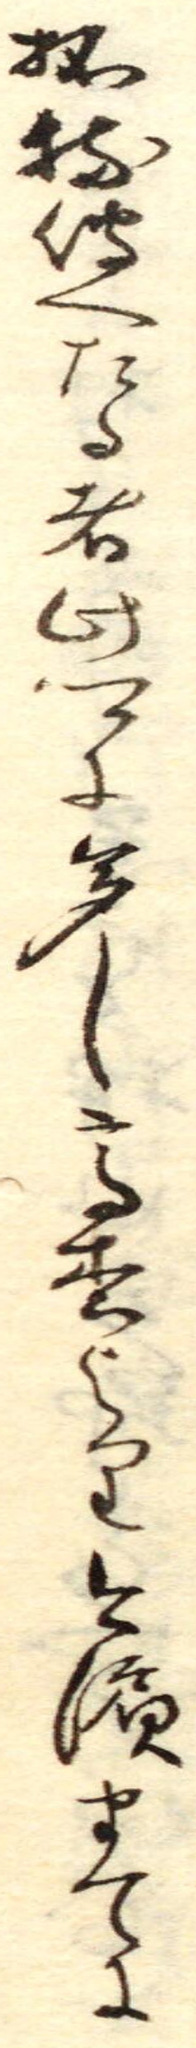抔持伝へたる者此郷に多し高枩より今濱まてに
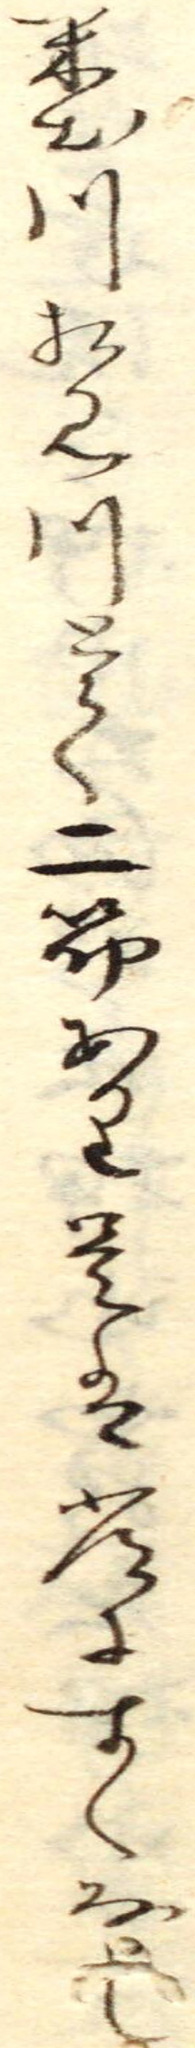米出川相見川とて二筋あり是は常にすくなし
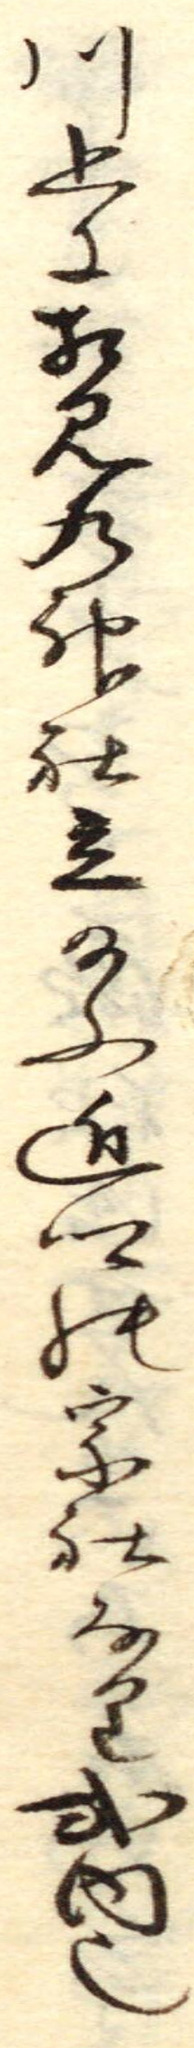川止に相見の神社立給ふ近郷の宗社なり式内也
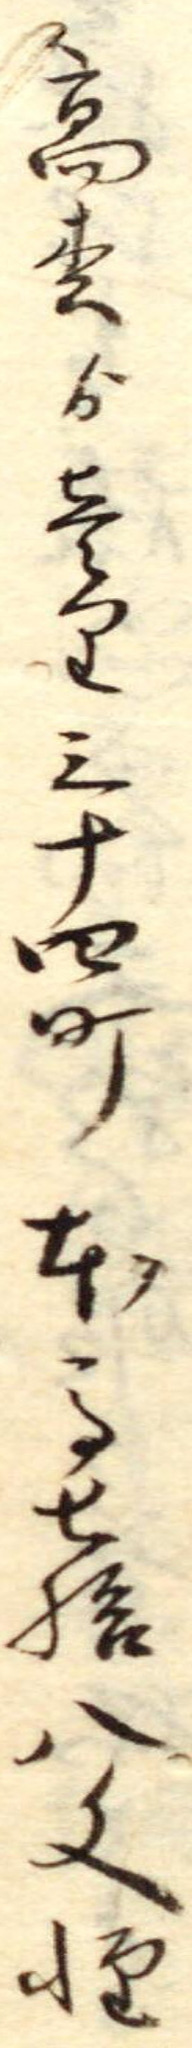高枩ゟ壱里三十四町本馬七拾八文軽
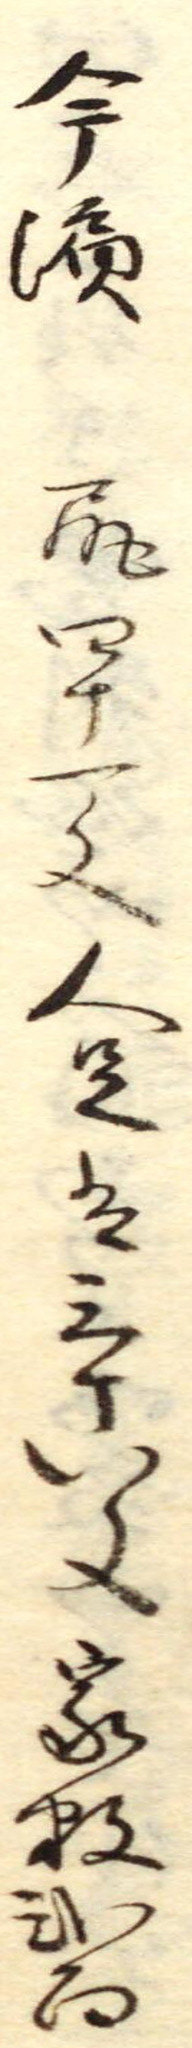今濱尻四十一文人足は三十八文家数弐百
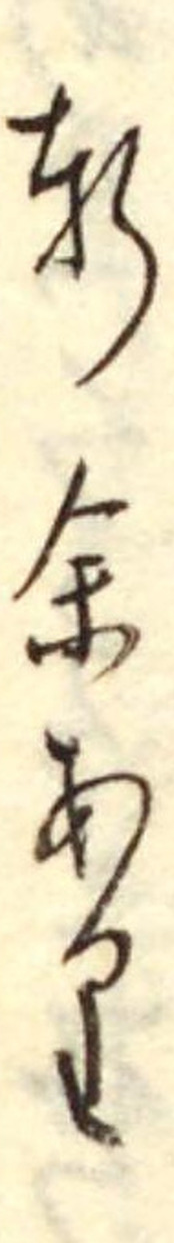軒余あり
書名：能登名跡誌
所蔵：Ishikawa Prefectural Library
